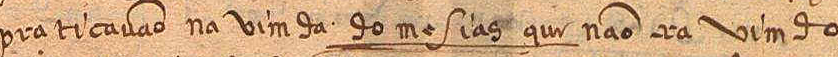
praticauão na vimda do mesias que não era vimdo
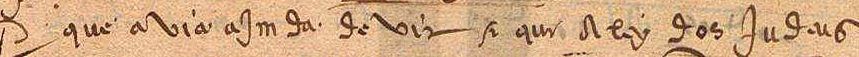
e que avia ajnda de vir e que A ley dos Judeus
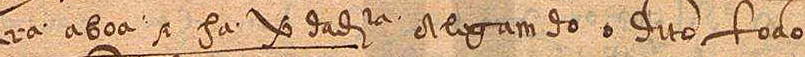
era a boa e ha ꝟdad̅ra Alegamdo o di̅to foão
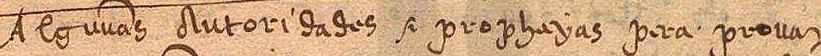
Alguu̅as Autoridades e prophecyas pera prouar
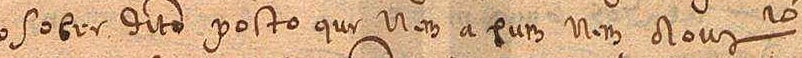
o soberdi̅to posto que nem a hum nem A outro
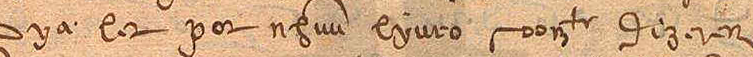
vya ler por nhu̅u lyuro soomte dizerem
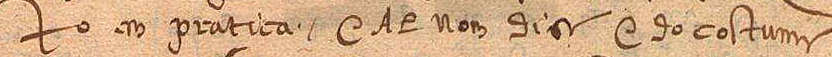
Jsto em pratica ./ e Al nom dise e do costume
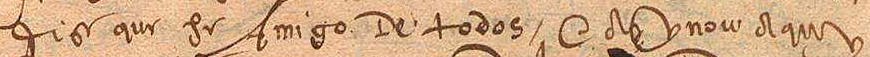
dise que he Amigo De todos / e Asynou Aquy
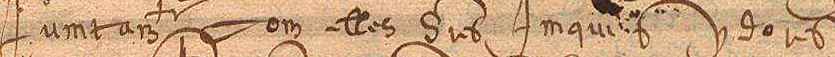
Jumtamte com elles Sr̅es Jmquisydores
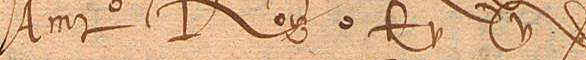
Amto Ro̅iz o stp̄vy…
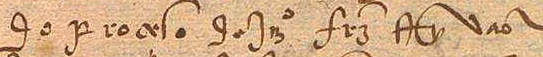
do proçeso do jmo frz̅ stp̄vão
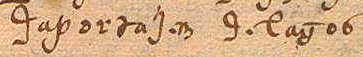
da portajem de lagos
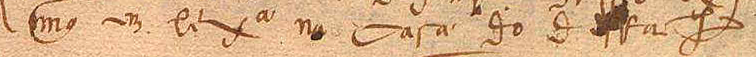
An̅no em lixa na Casa do despacho
